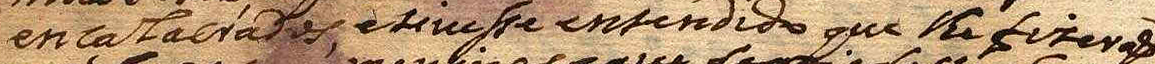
ençalacrados, e tiuesse entendido que lhe fizeraõ
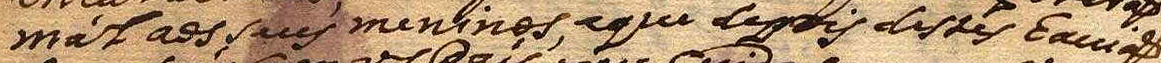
máL aos seus meninos, e que depois destes hauiaõ
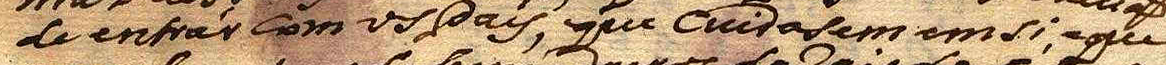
de entrar com os Pais, que cuidasem em si, e que
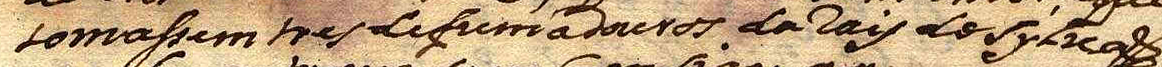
tomassem tres defumadouros da Rais do syluaõ
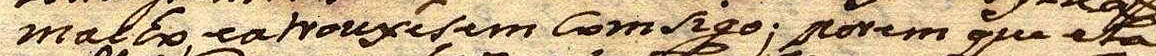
macho, e a trouxesem comsigo; porem que ela
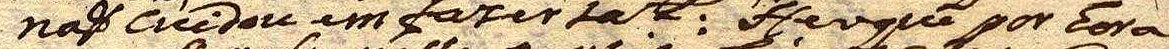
naõ cuidou em fazer tal: He o que por hora
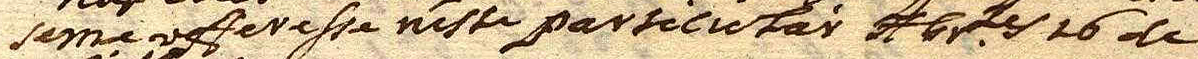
se me offeresse neste particular Abr.tes 16 de
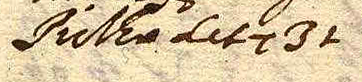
Iulho de 1731.
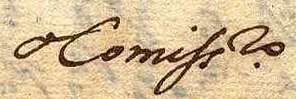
o Comiss.ro
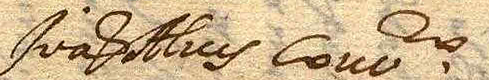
Joaõ Alues Couv.ro
